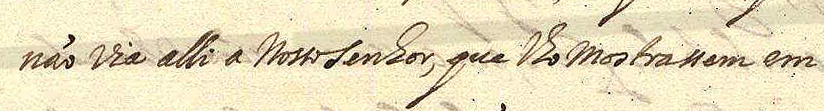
naõ via alli a nosso senhor, que lho mostrassem em
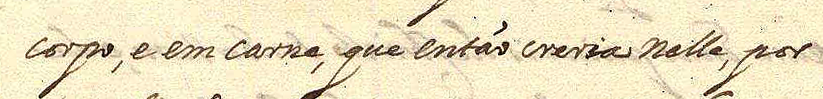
corpo, e em carne, que entaõ creria nelle, por
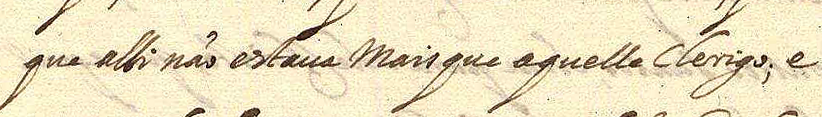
que alli não estaua mais que aquelle clerigo; e
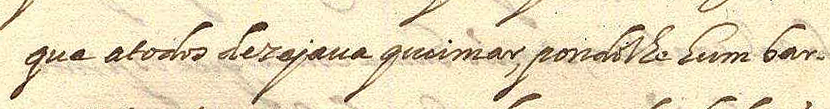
que a todos dezejaua queimar, pondolhe hum bar
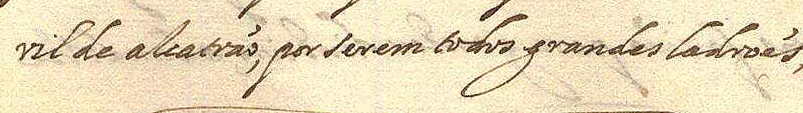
ril de alcatraõ, por serem todos grandes ladroẽs,
